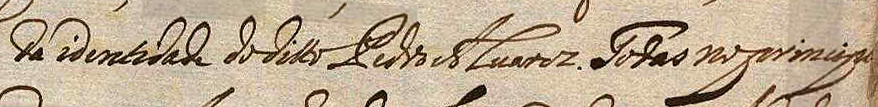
da identidade do ditto Pedro Aluarez. Todas no princip
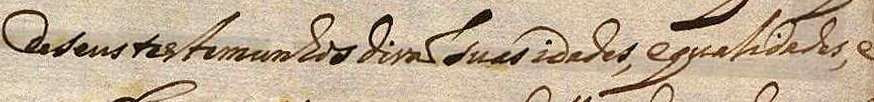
de seus testemunhos diraõ suas idades, e qualidades, e
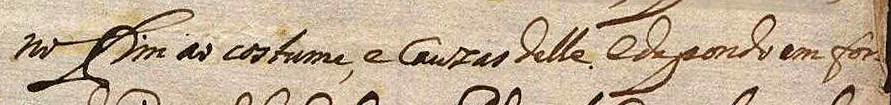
no fim ao costume, e cauzas delle e depondo em for
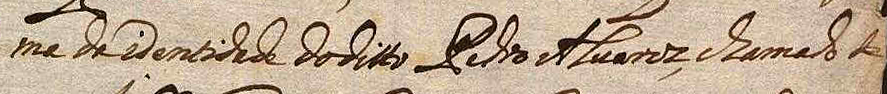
ma da identidade do ditto Pedro Aluarez, chamado de
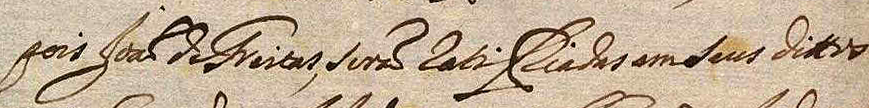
pois Joaõ de Freitas, seraõ Ratificadas em seus dittos
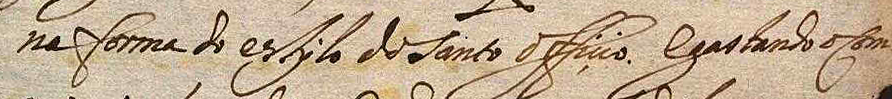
na forma do estylo do Santo offiçio. E gastando o Com
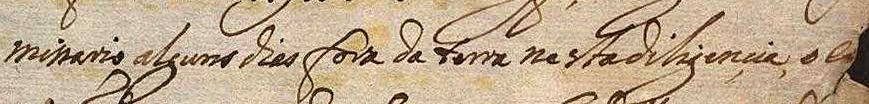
missario alguns dias fora da terra nesta diligençia, o es
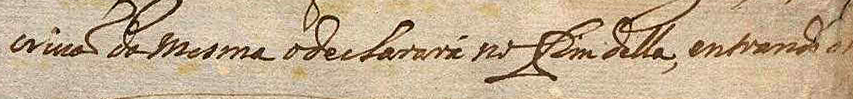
criuaõ da mesma o declarará no fim della, entrando o
